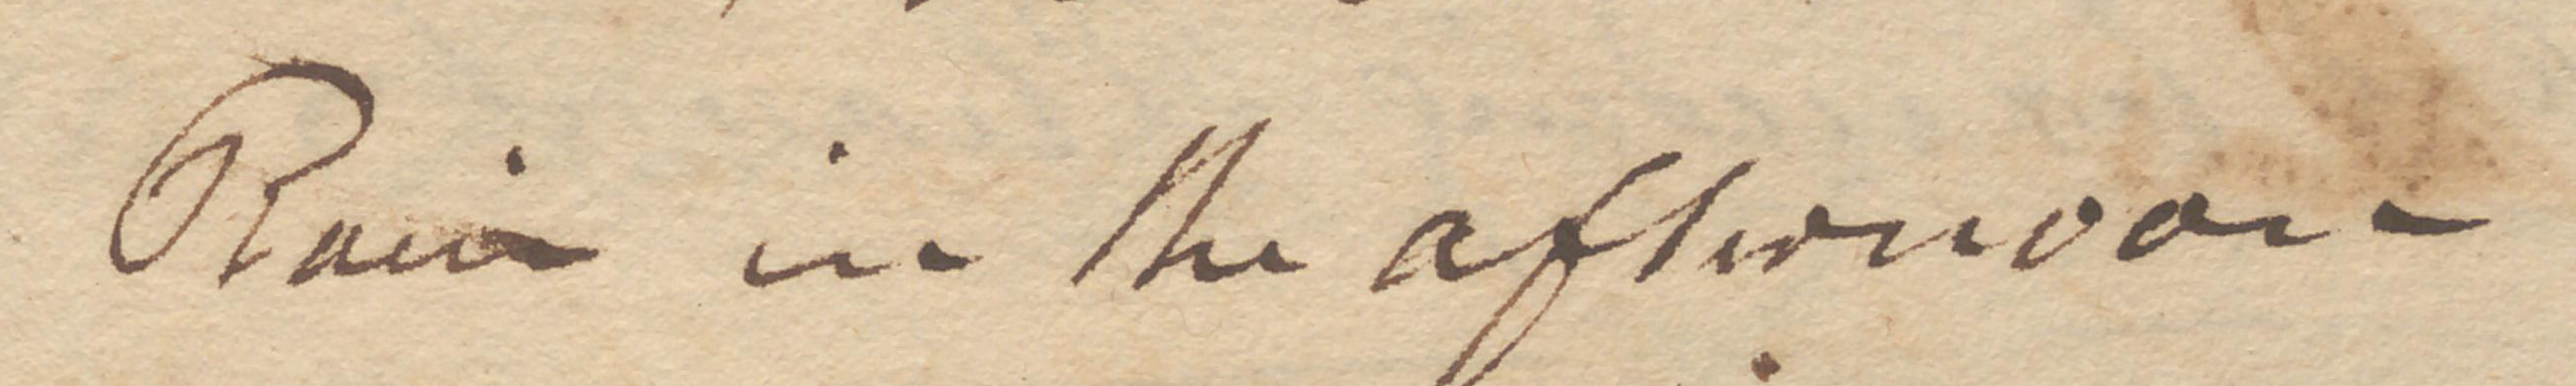Rain in the afternoon
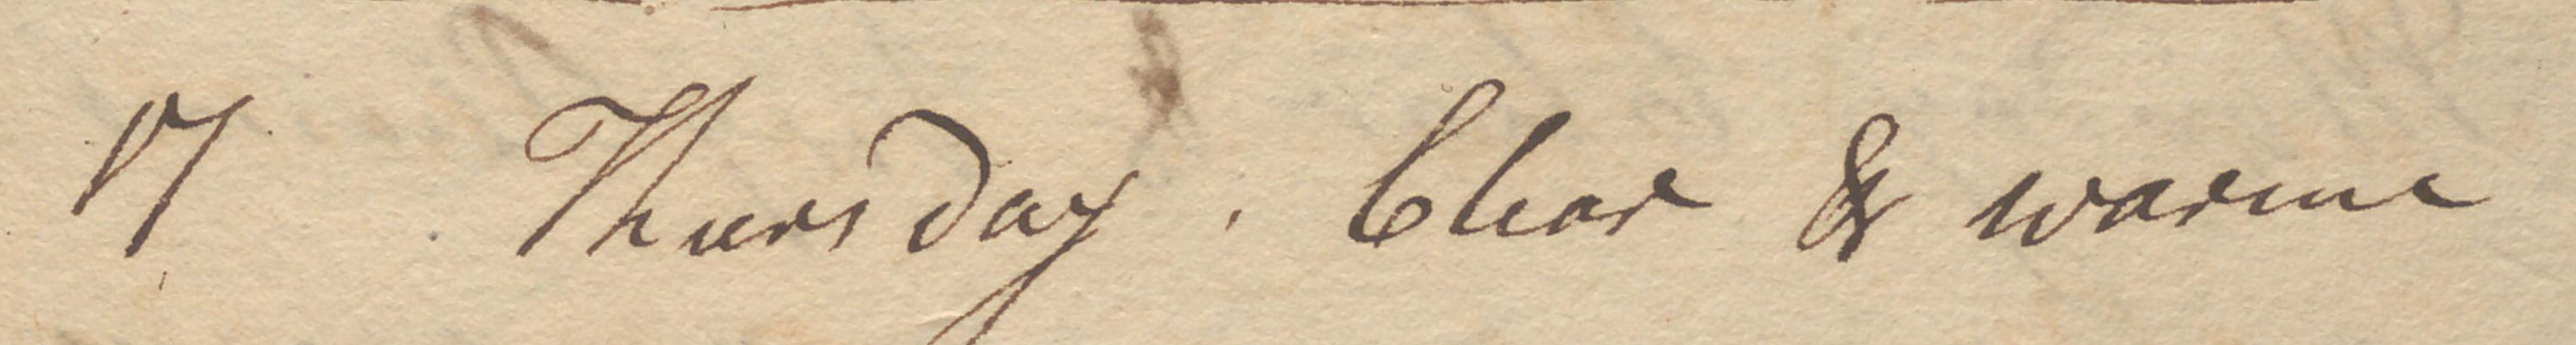17 Thursday. Clear & warme
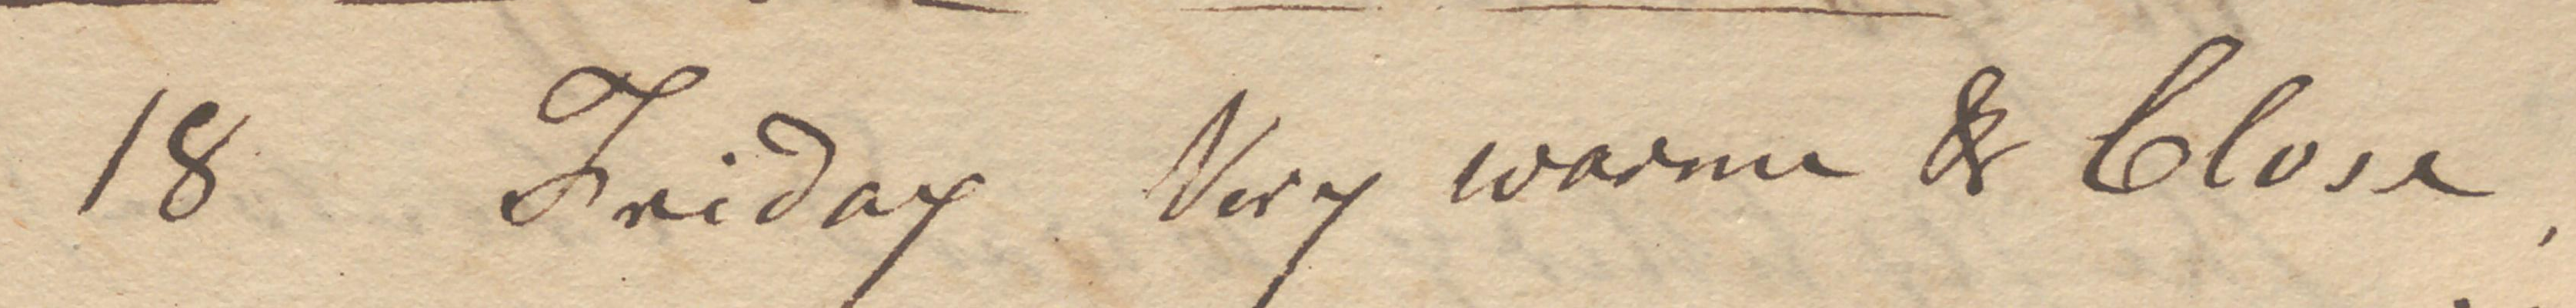18 Friday, Very warme & Close
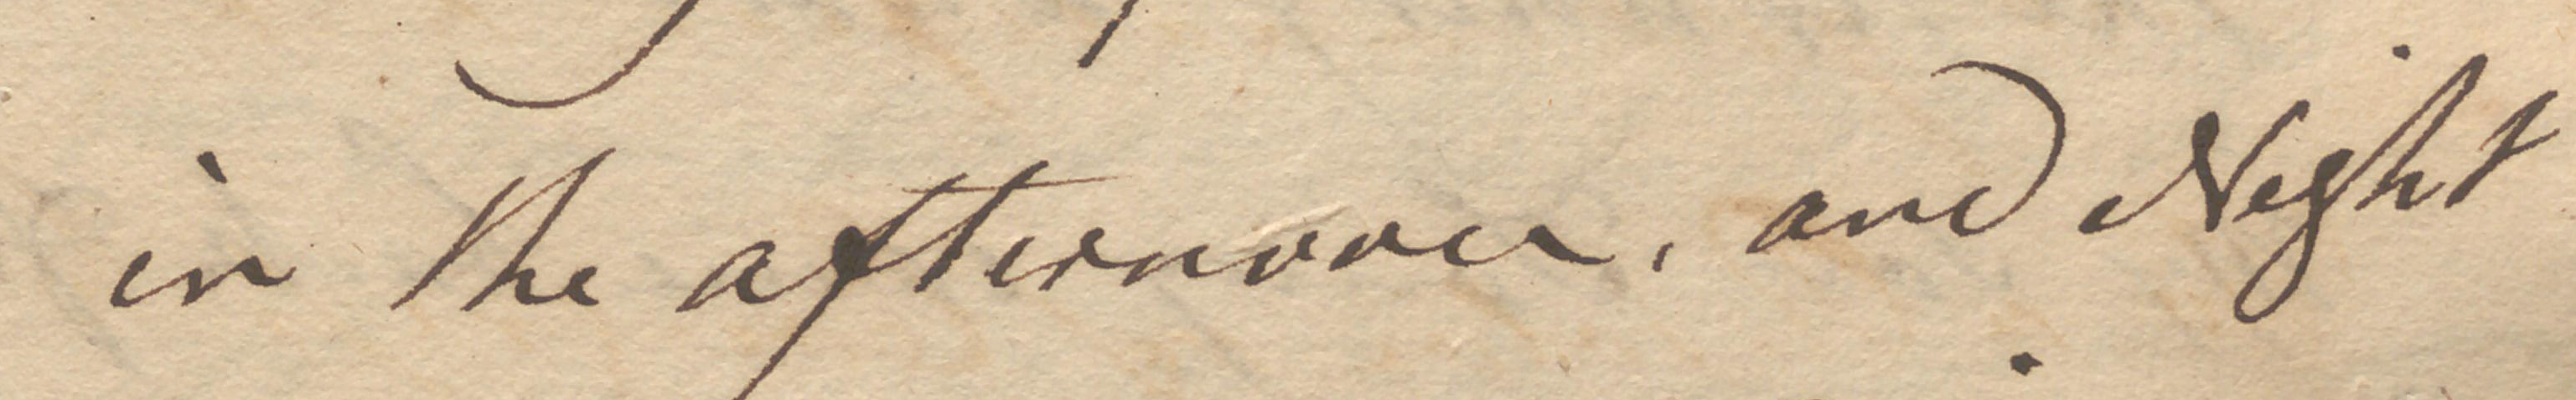in the afternoon, and Night
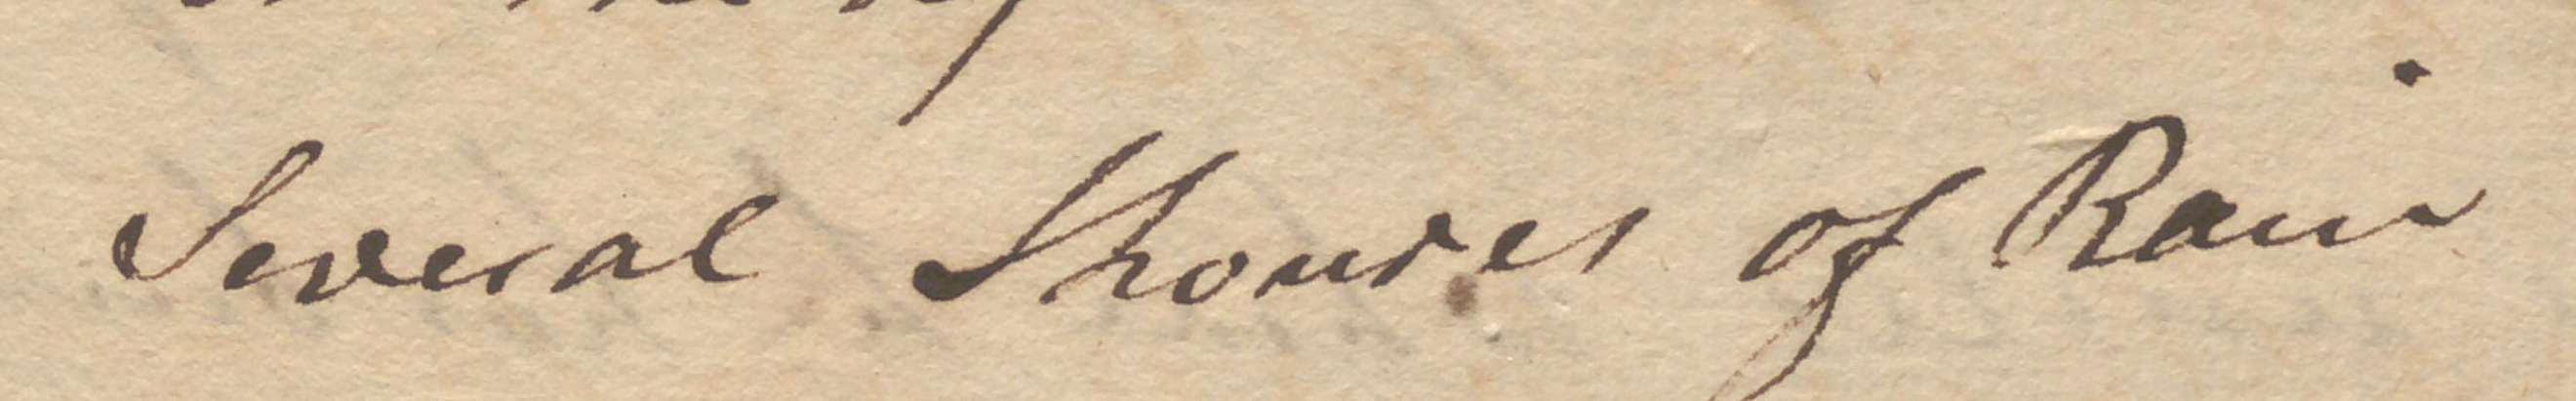Several Shoures of Rain
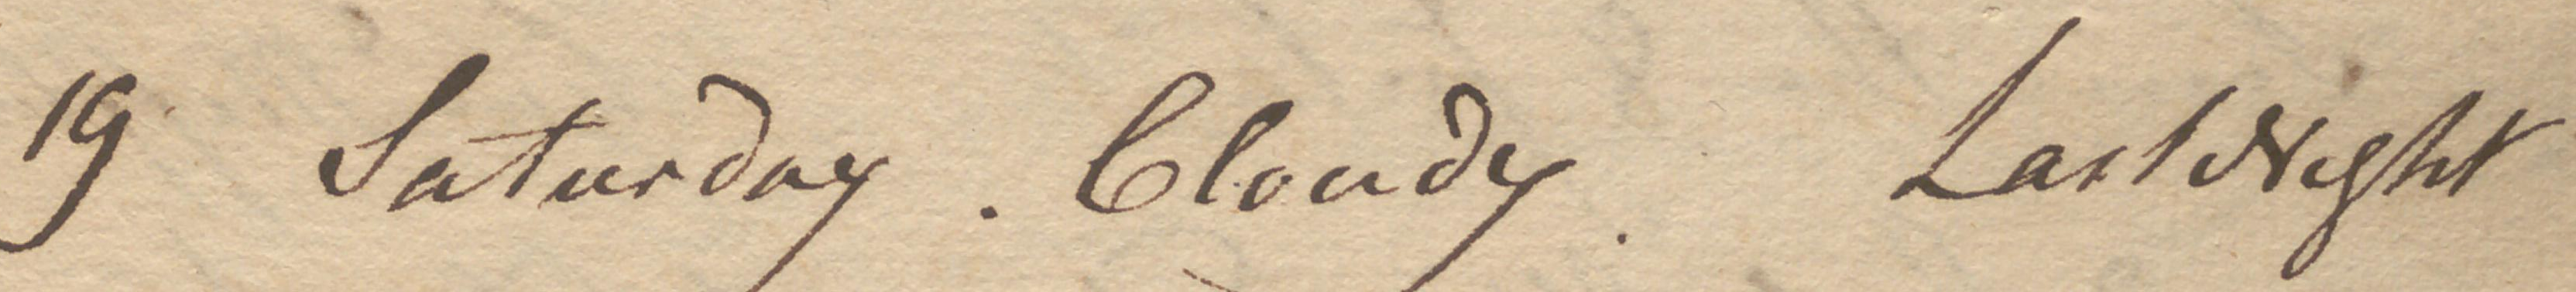19 Saturday Cloudy Last Night
